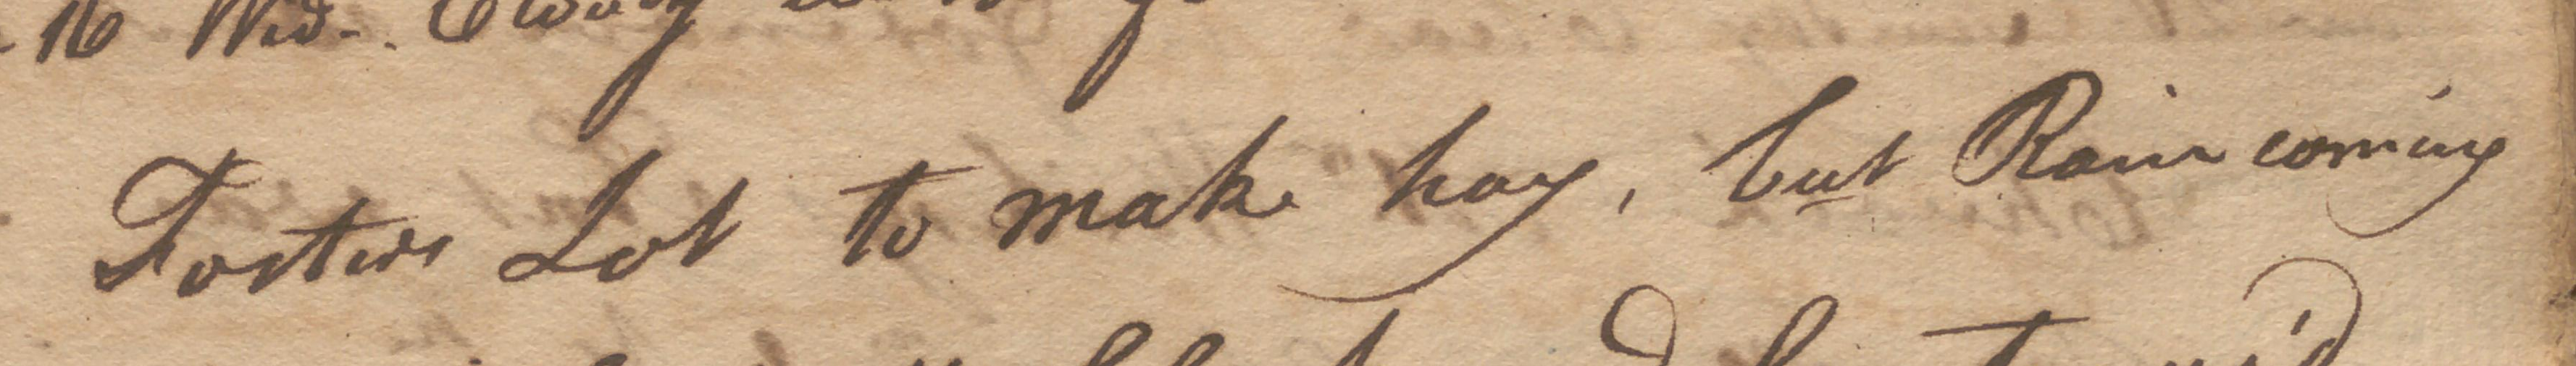Fosters Lot to make hay, but Rain coming
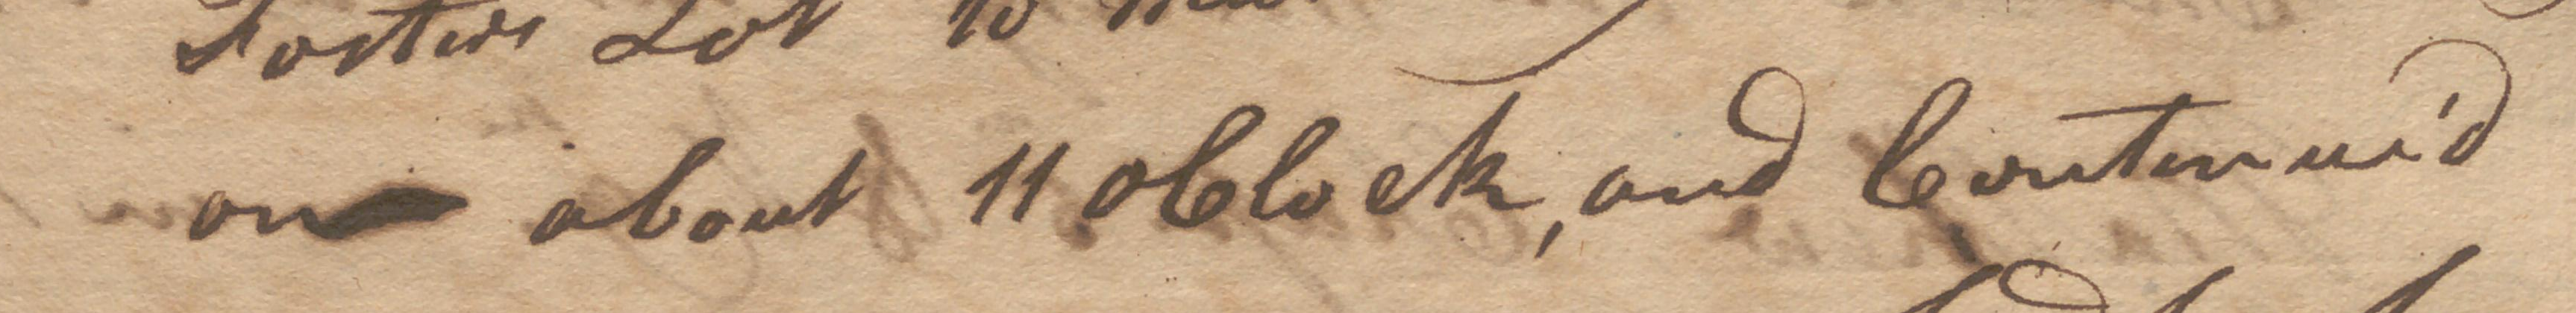on about 11 oClock, and Continu'd
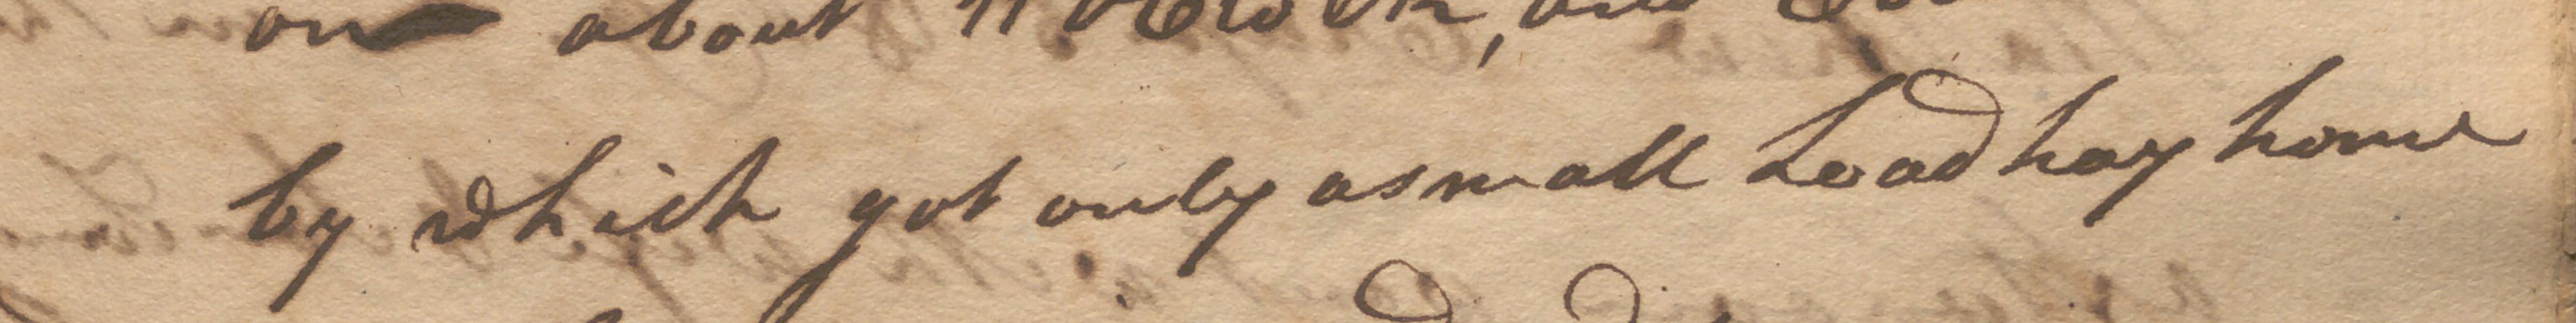by which got only a small Load hay home
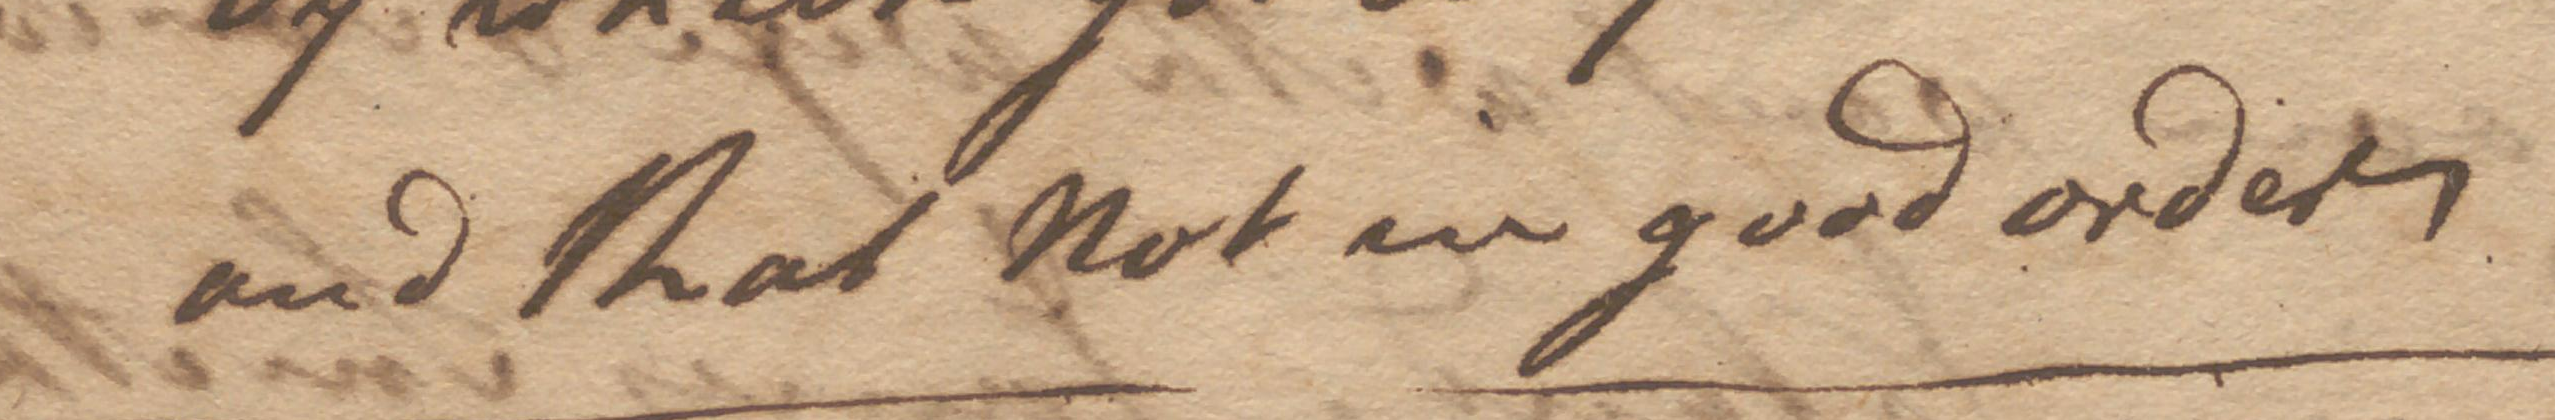and that not in good order
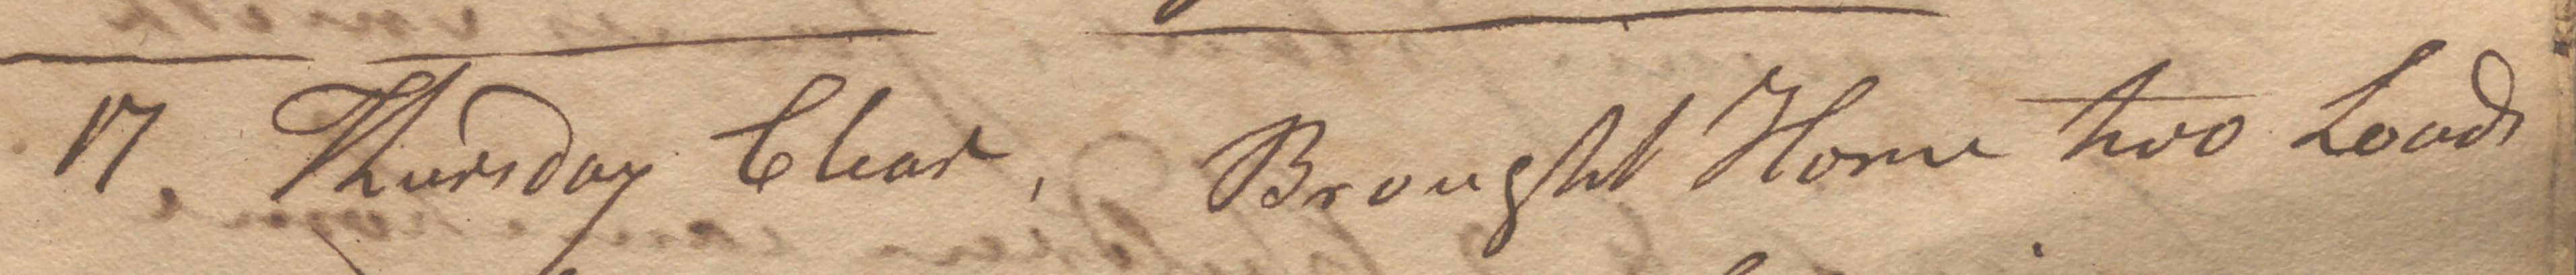17. Thursday Clear, Brought Home two Loads
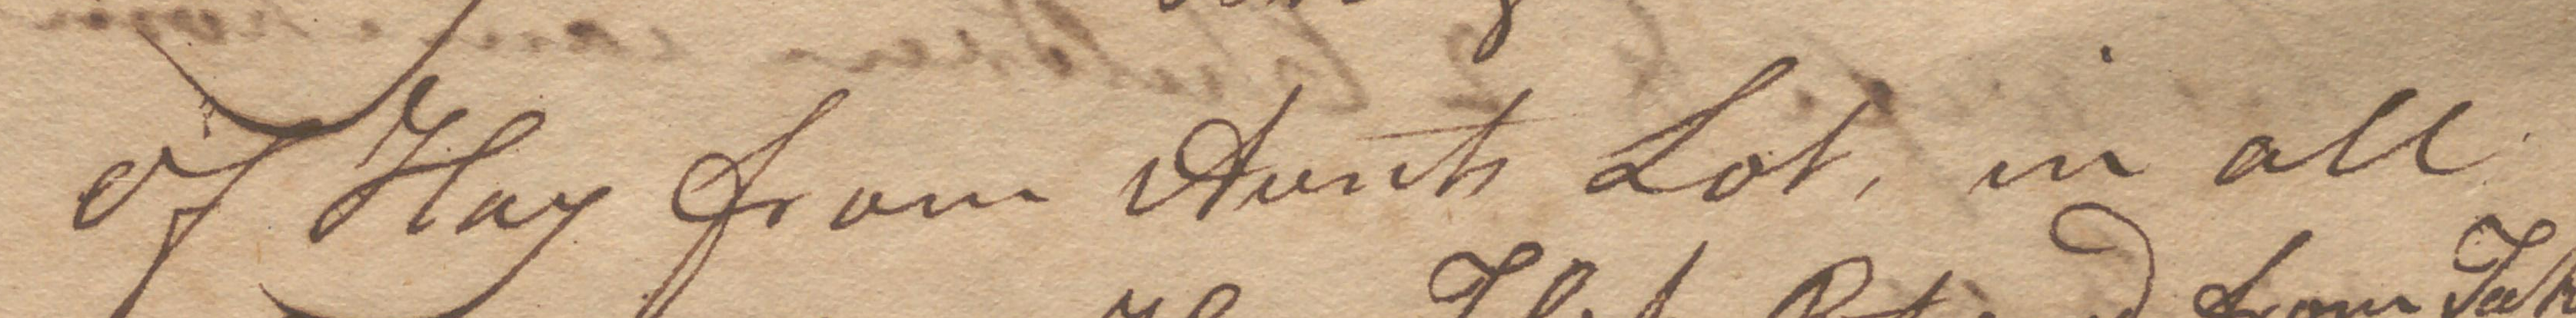of Hay from Aunts Lot, in all
